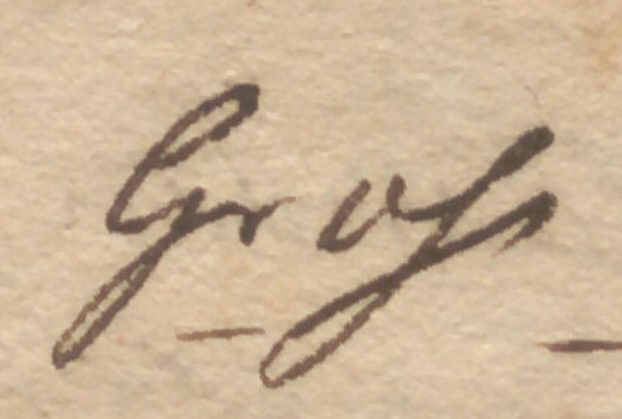Gross
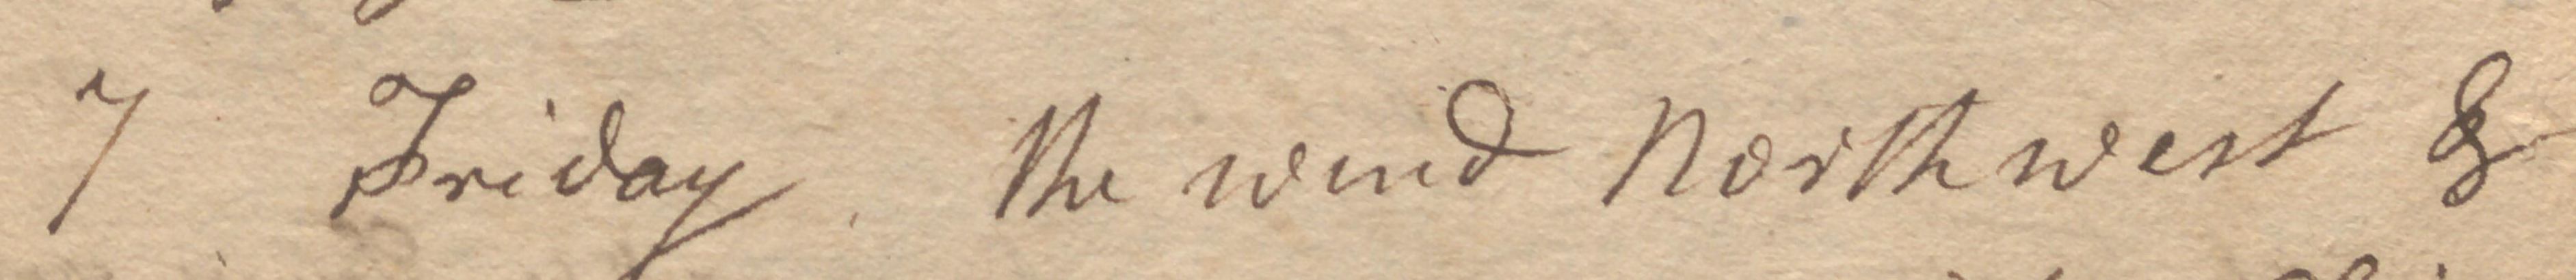7 Friday the wind North west &
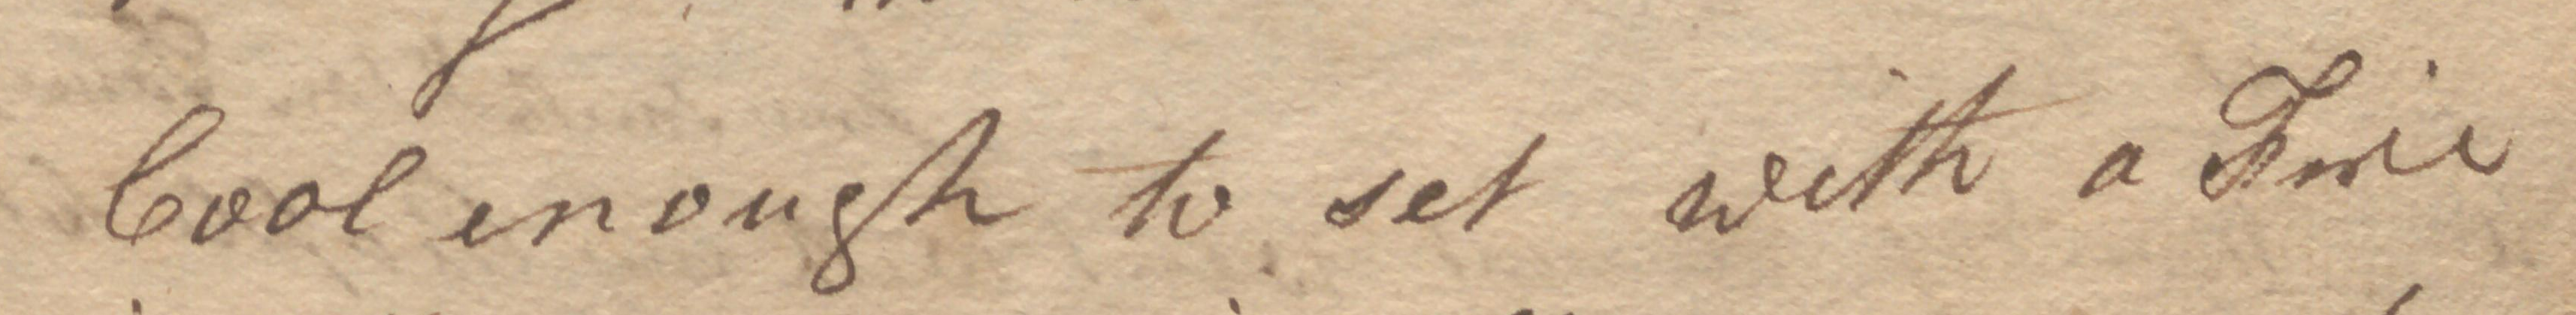Cool enough to set with a Fire
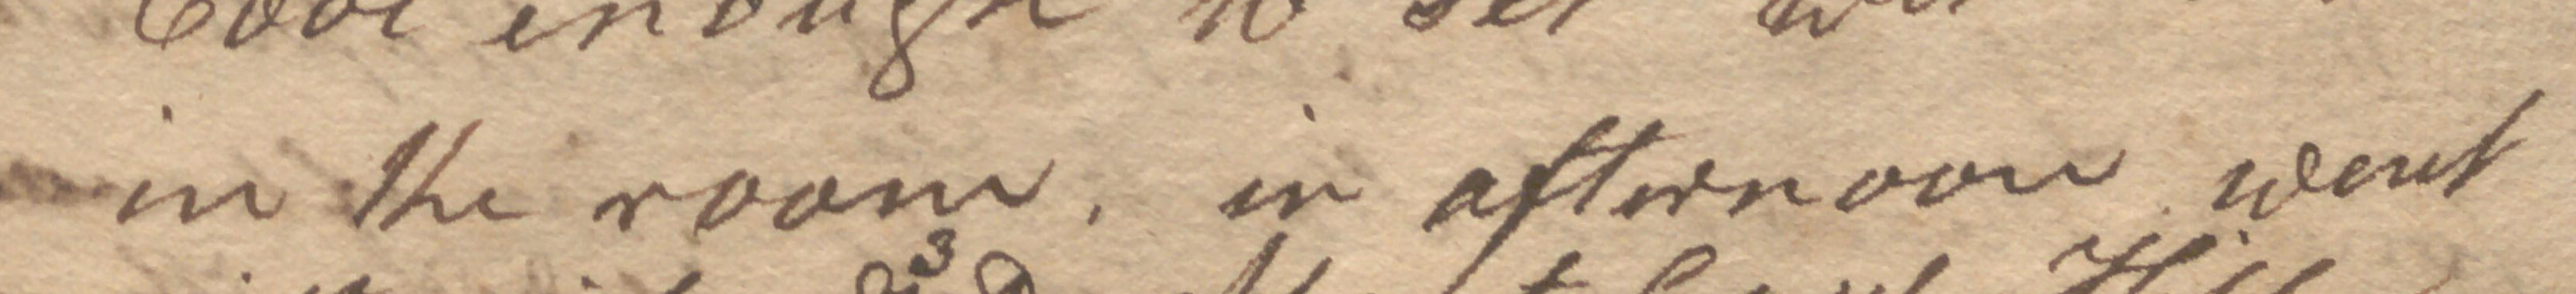in the room, in afternoon, went
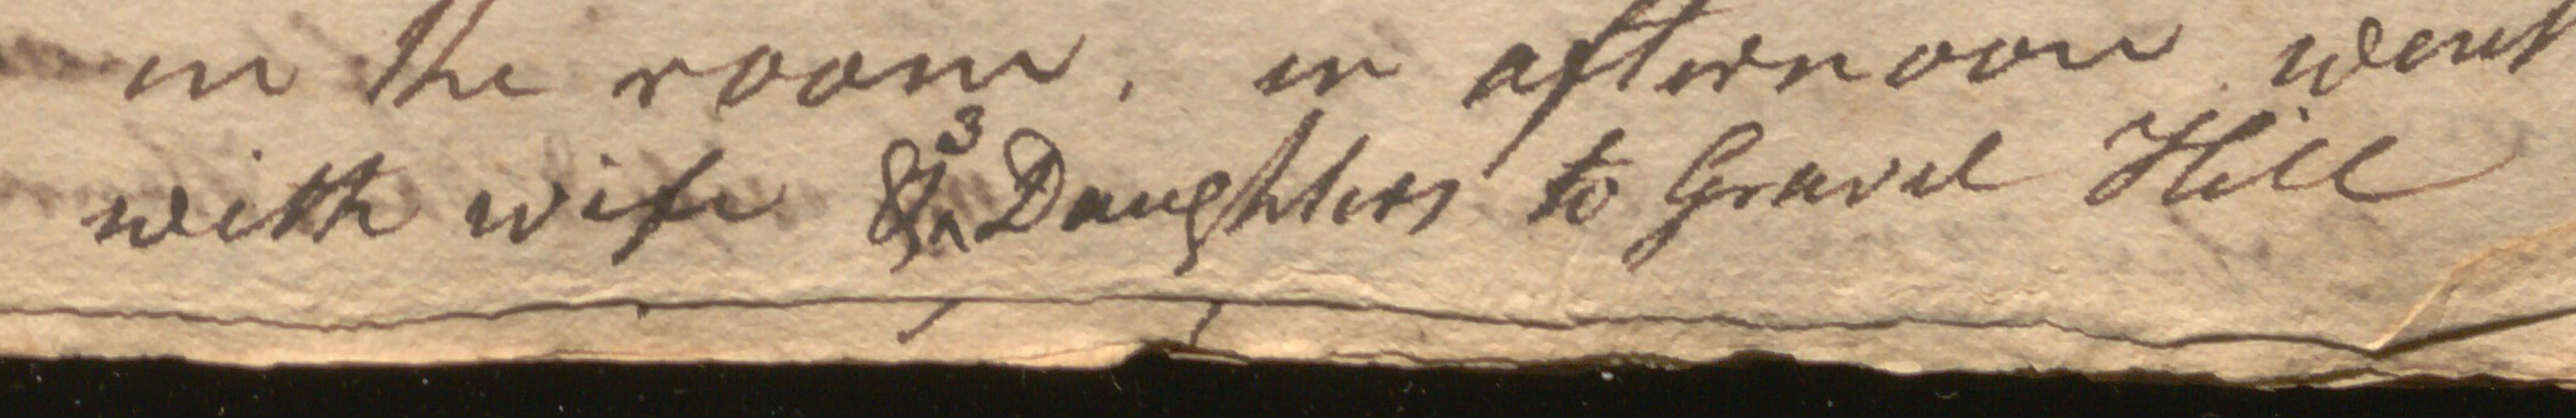with wife & ^3 Daughters to Gravel Hill
